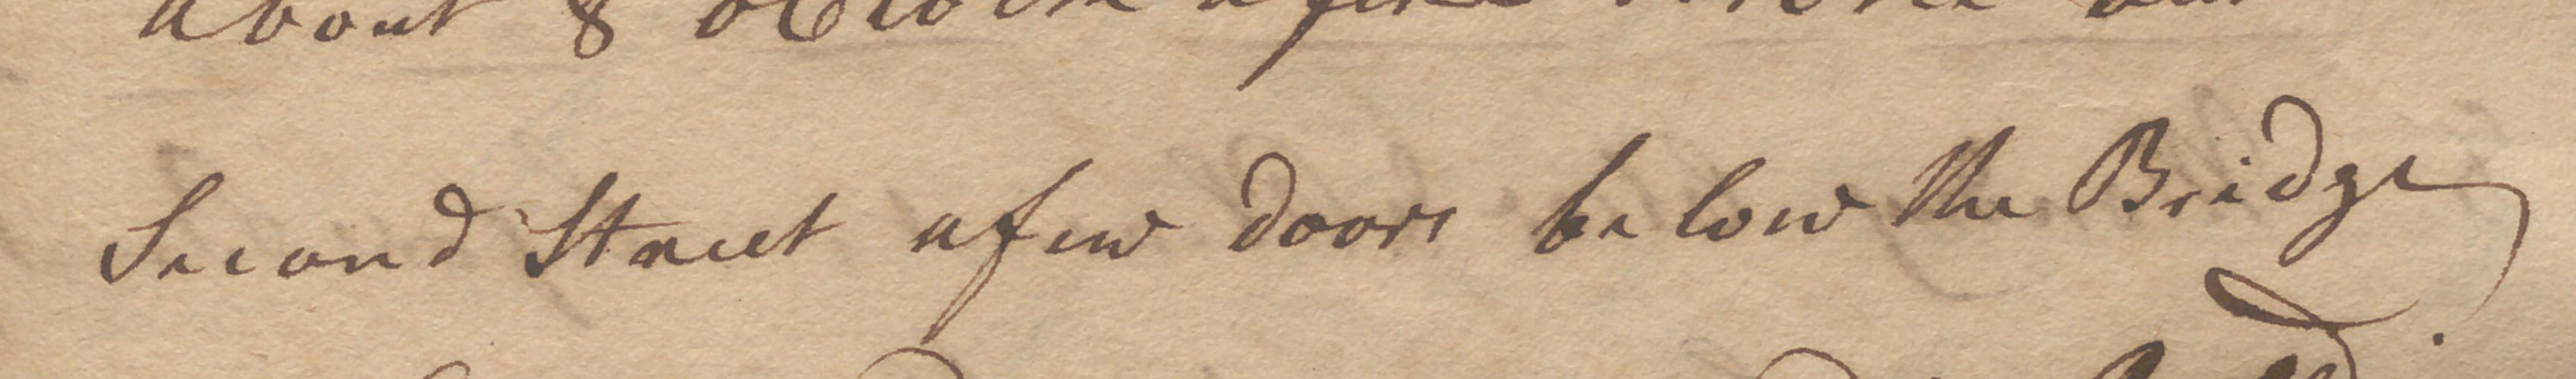Second Street a few doors below the Bridge
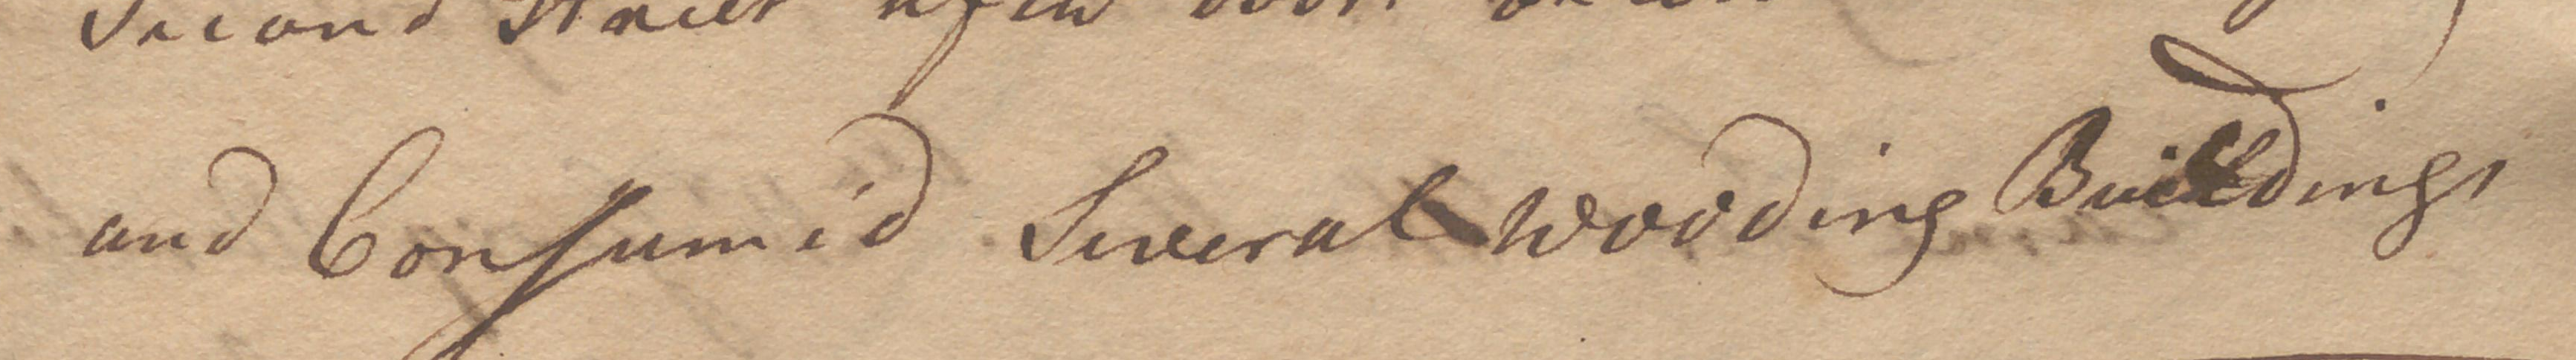and Consum'd Several Wooding Buildings
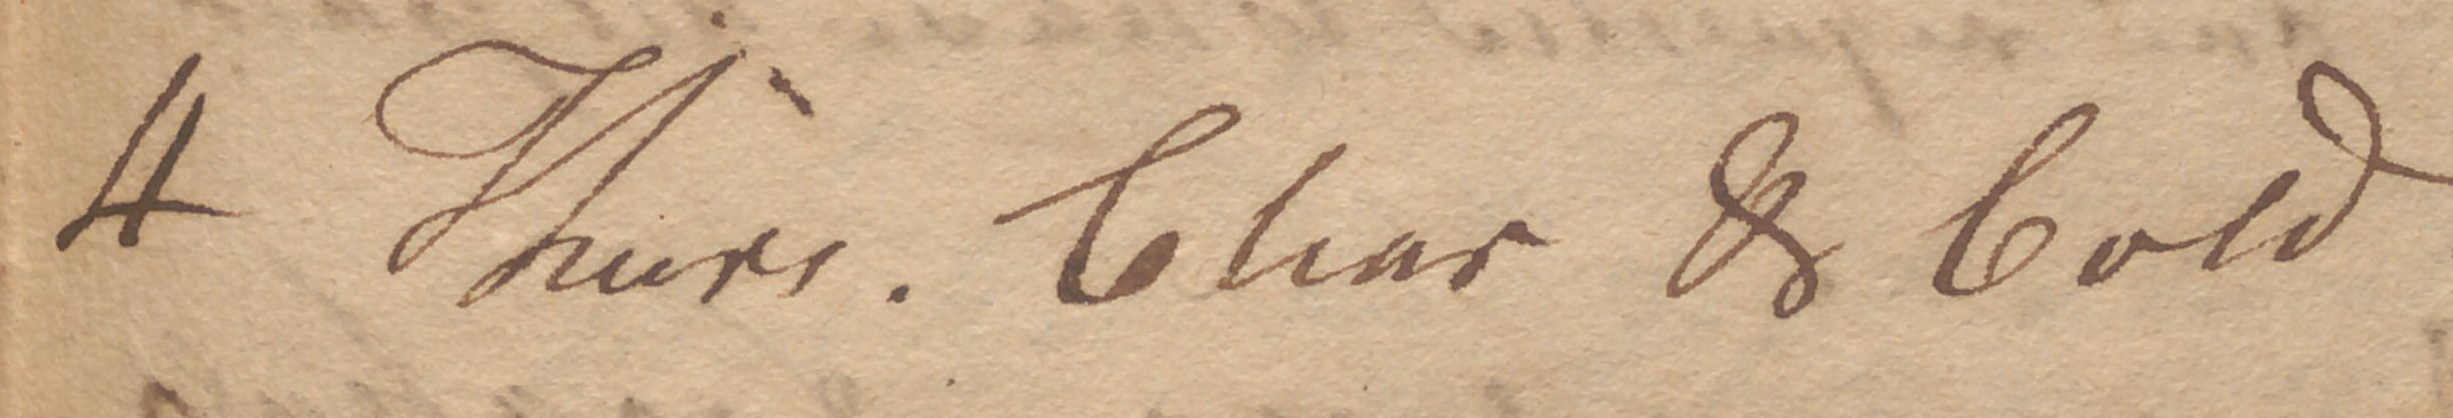4 Thurs. Clear & Cold
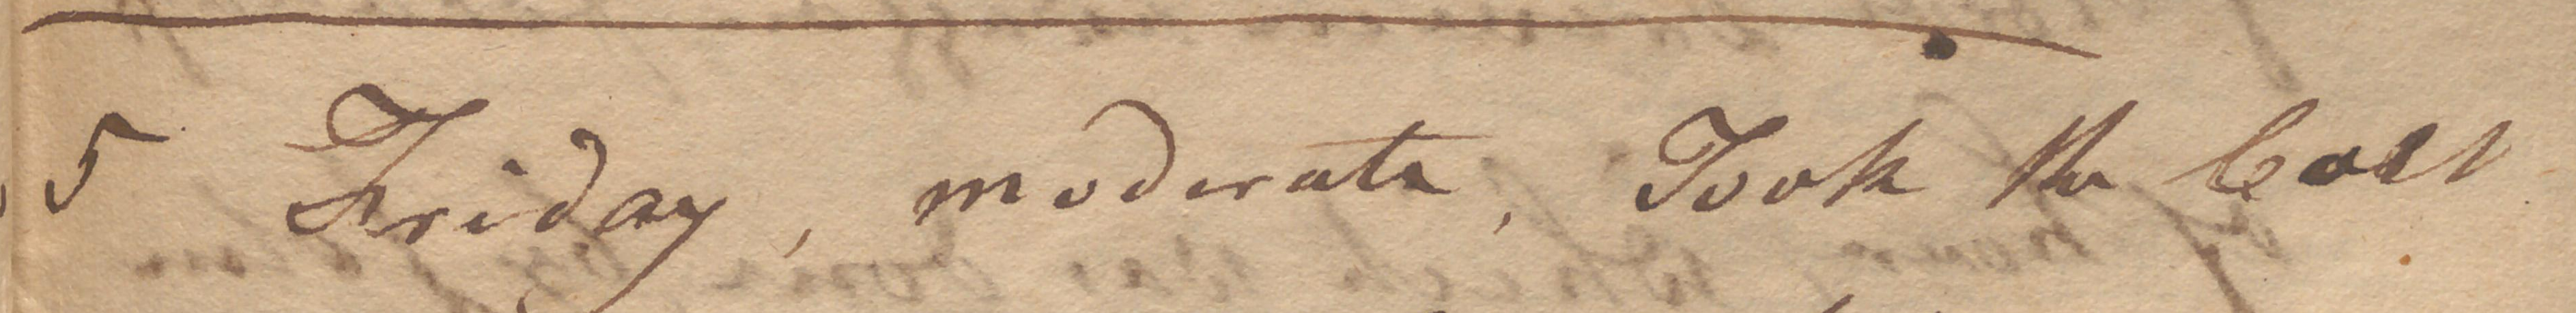5 Friday moderate Took the Colt
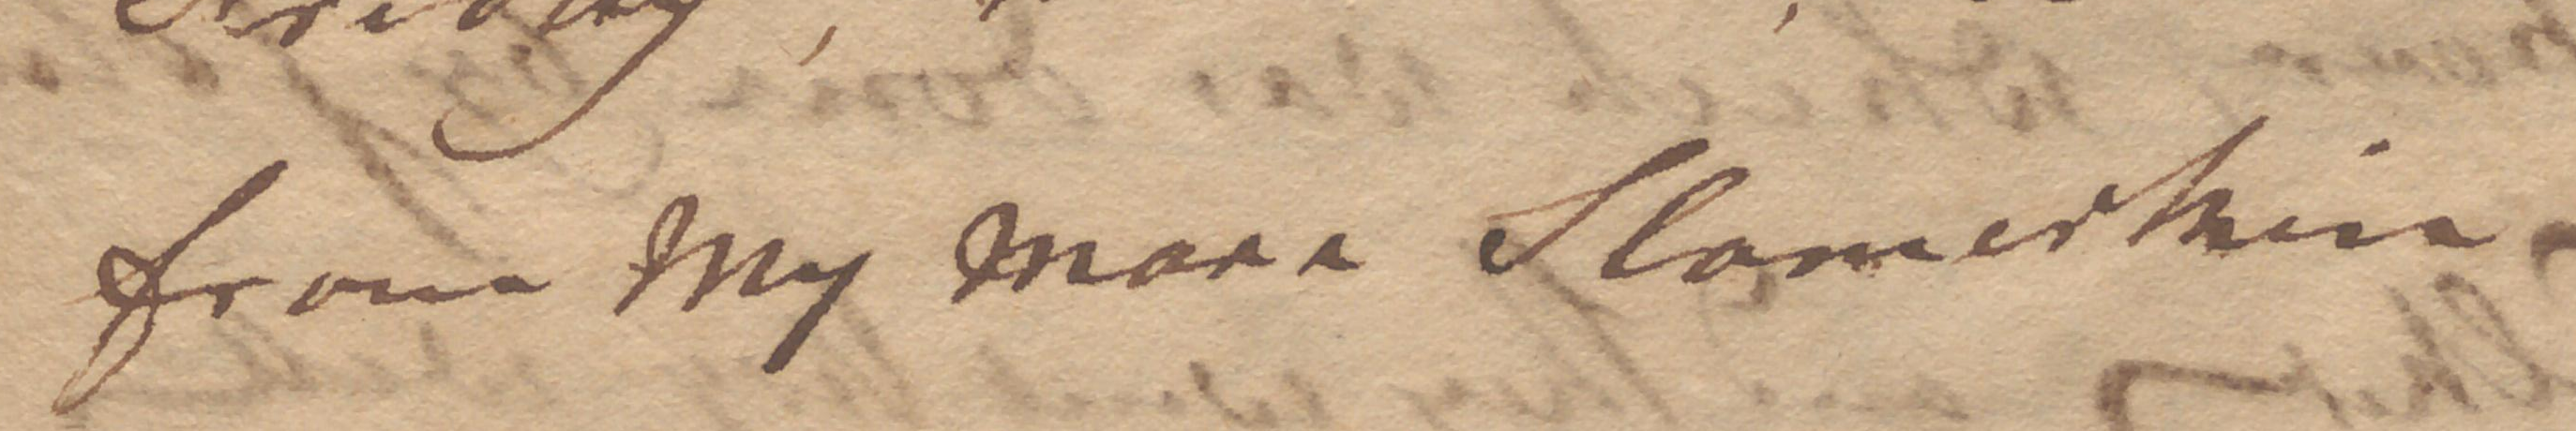from My mare Slamerkin
